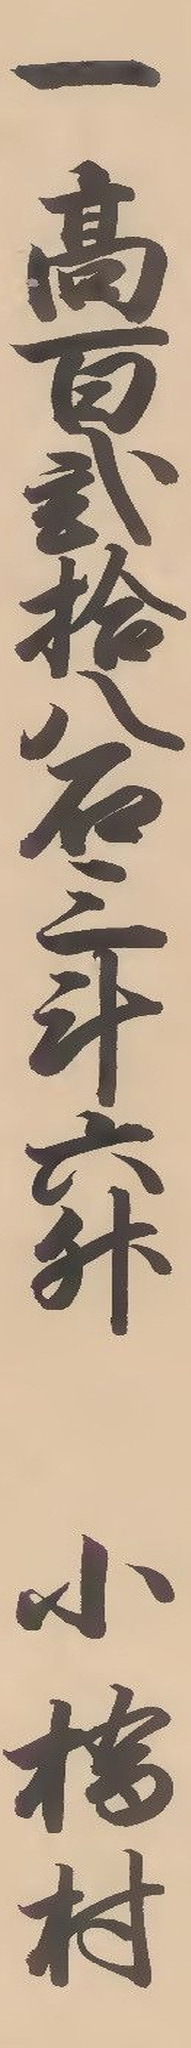一高百弐拾八石三斗六升小橋村

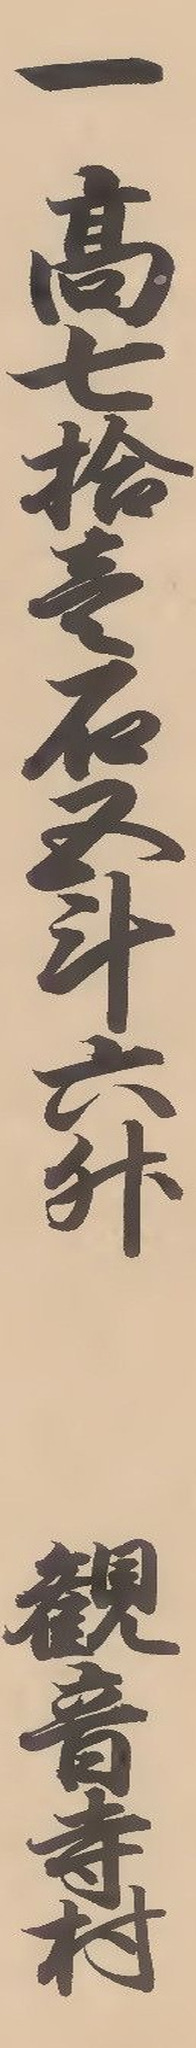一高七拾壱石五斗六升観音寺村
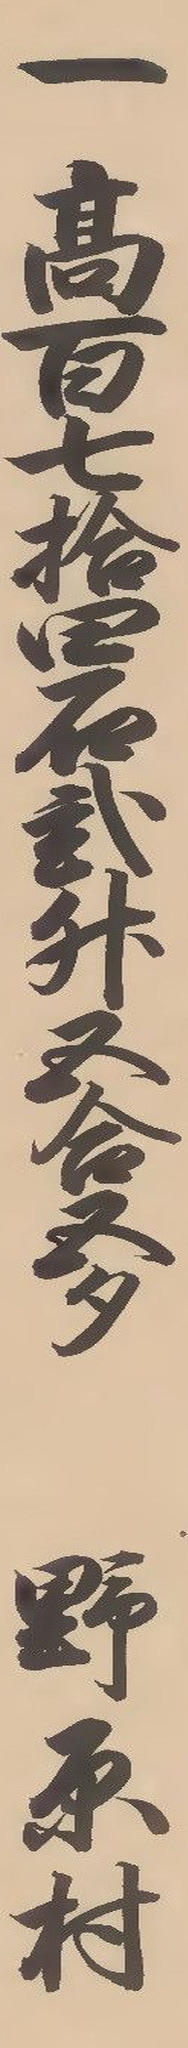一高百七拾四石弐升五合五勺野原村
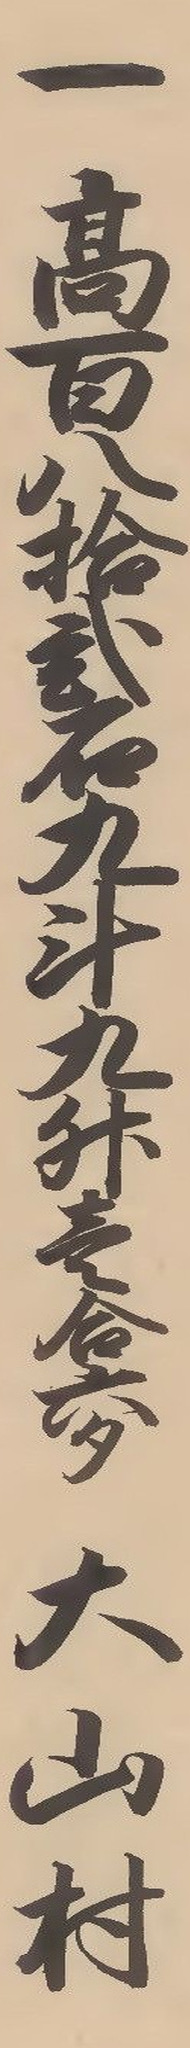一高百八拾弐石九斗九升壱合六勺大山村
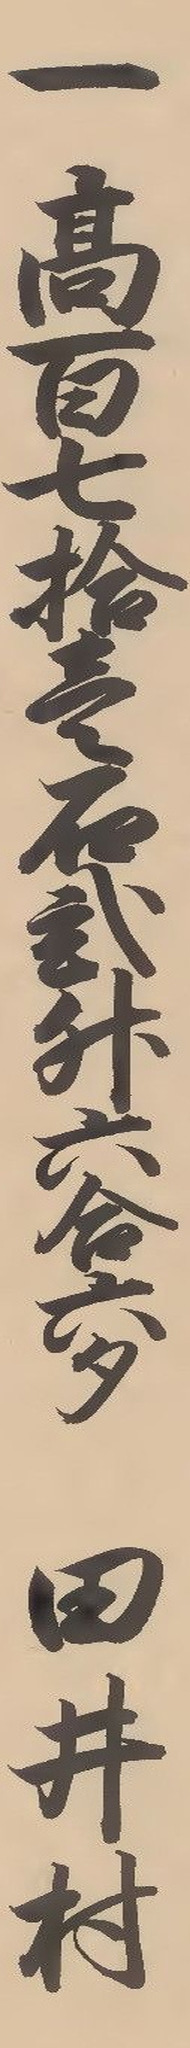一高百七拾壱石弐升六合六勺田井村
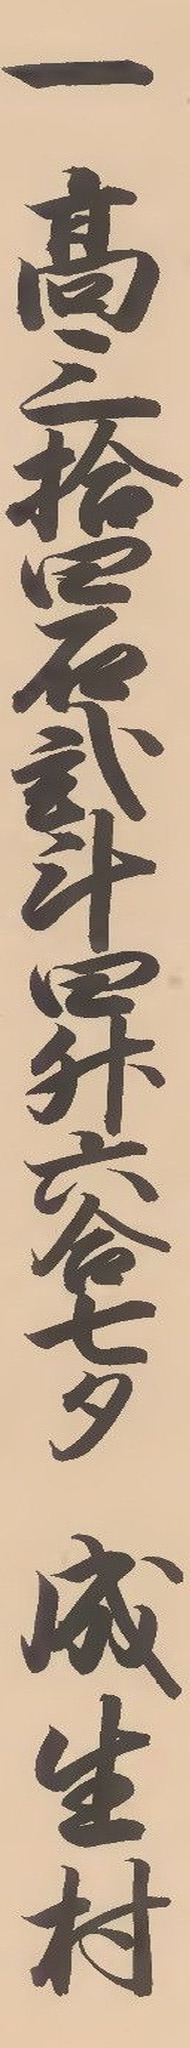一高三拾四石弐斗四升六合七勺成生村
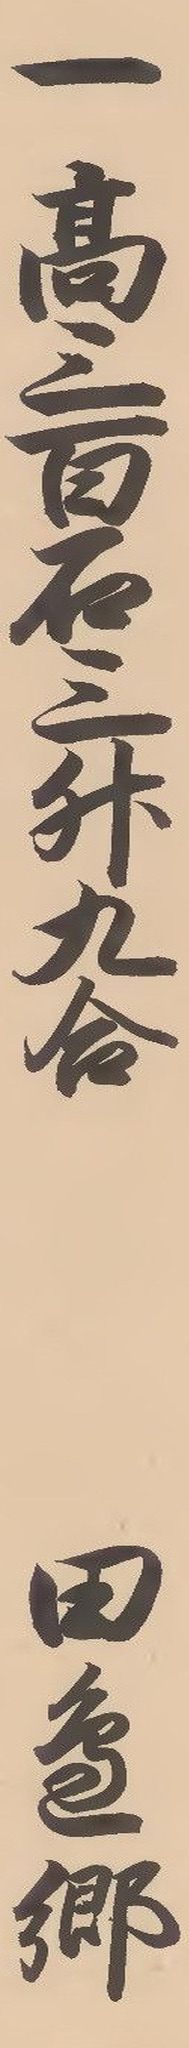一高三百石三升九合田辺郷
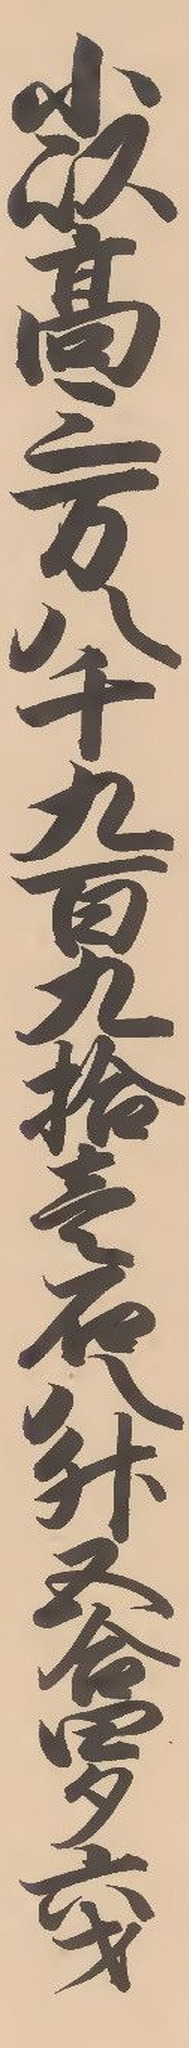小以高三万八千九百九拾壱石八升五合四勺六才

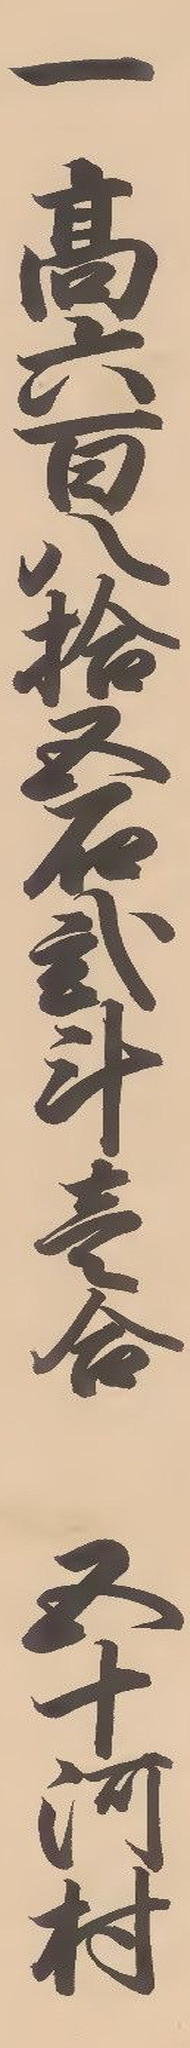一高六百八拾五石弐斗壱合五十河村
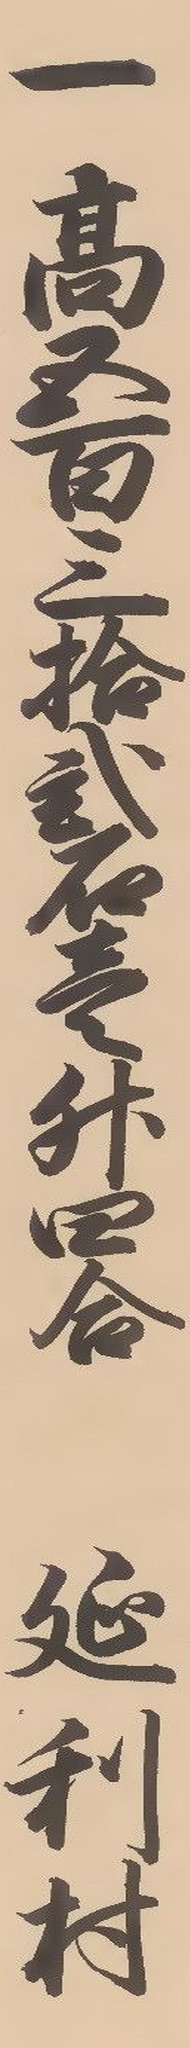一高五百三拾弐石壱升四合延利村
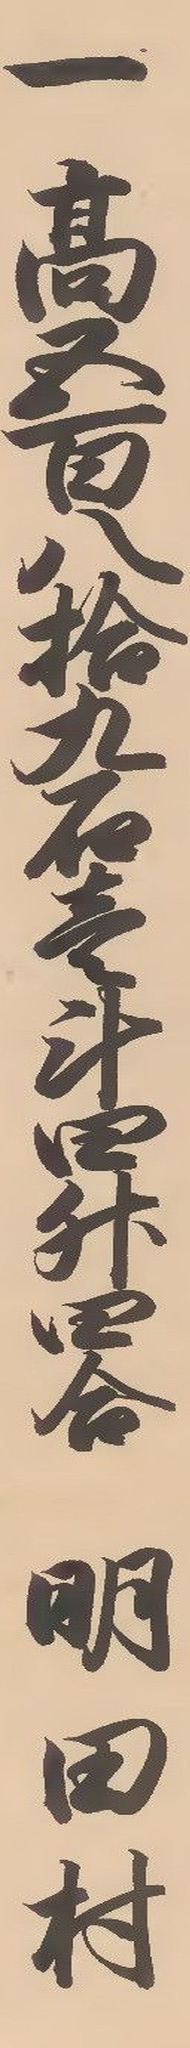一高五百八拾九石壱斗四升四合明田村
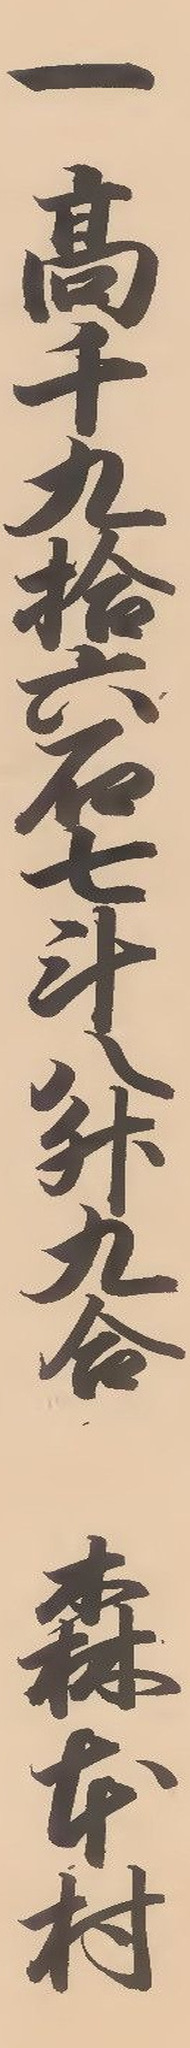一高千九拾六石七斗八升九合森本村
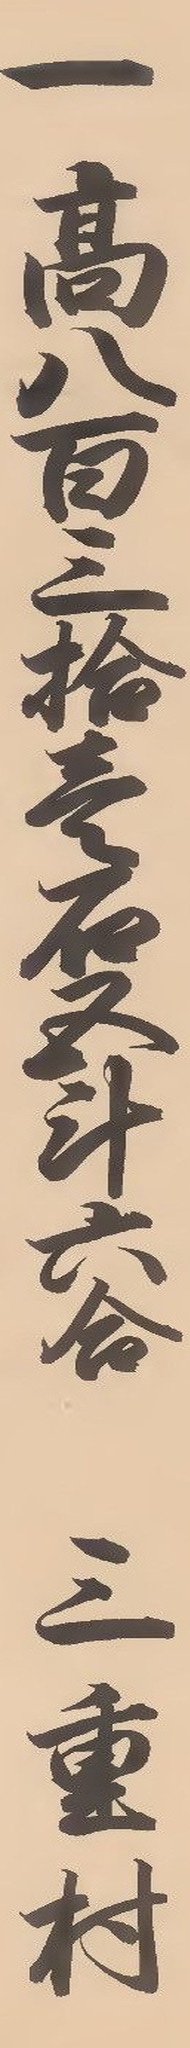一高八百三拾壱石五斗六合三重村
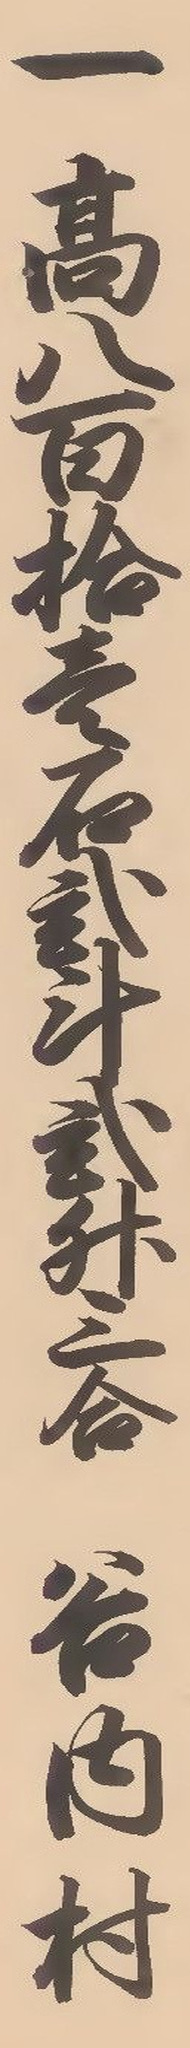一高八百拾壱石弐斗弐升三合谷内村

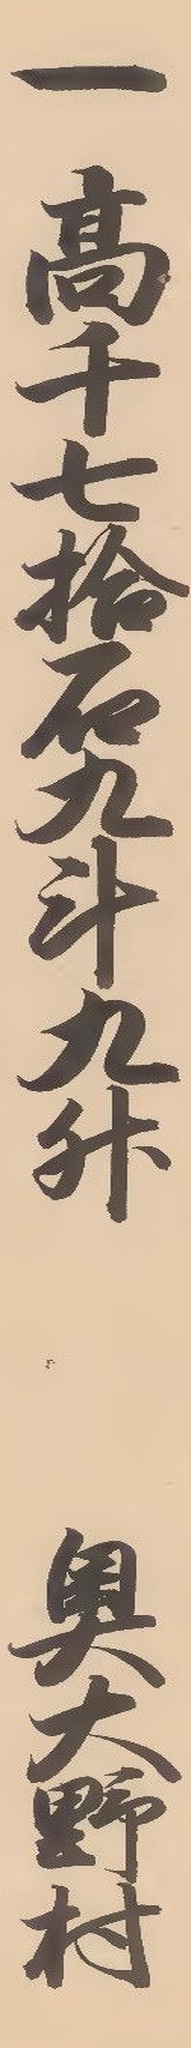一高千七拾石九斗九升奥大野村
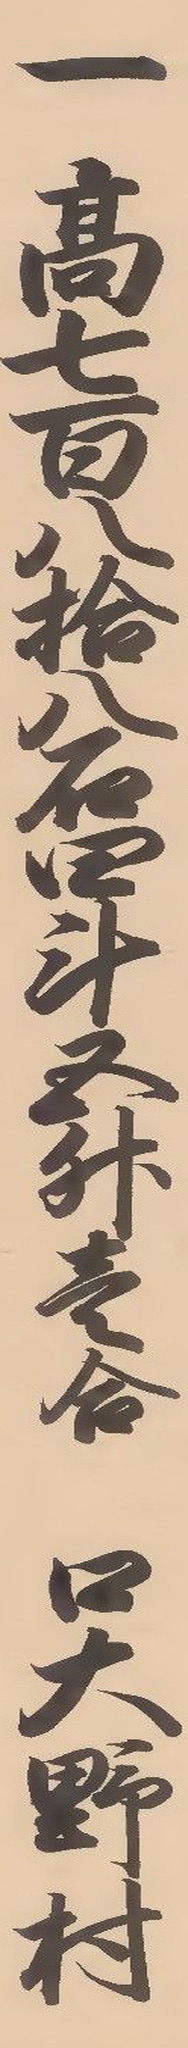一高七百八拾八石四斗五升壱合口大野村
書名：丹後国郷帳
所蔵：国立公文書館 National Archives of Japan
